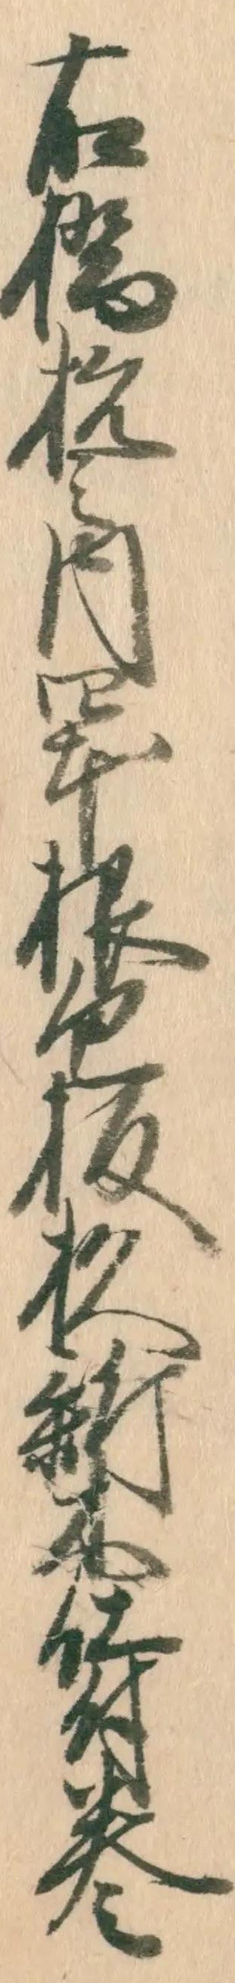右橋杭之内四本根包板杉新木仕付巻

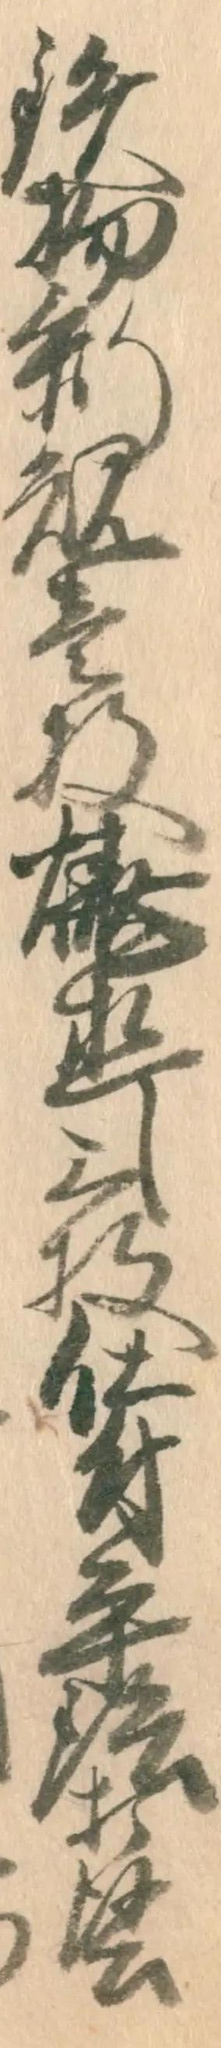鉄物新規壱枚焼直し三枚仕付平鋲打堅
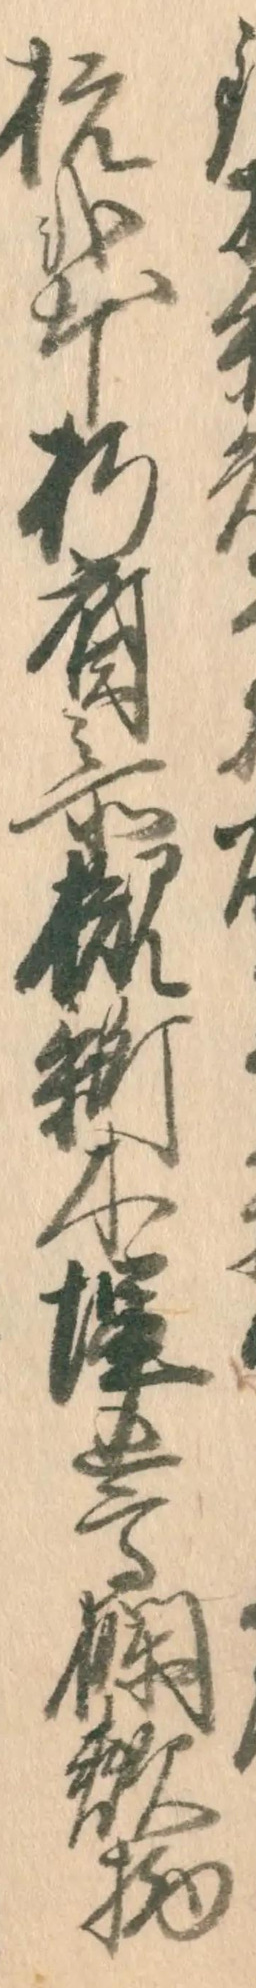杭弐本朽腐之所槻新木埋込高欄頬柄
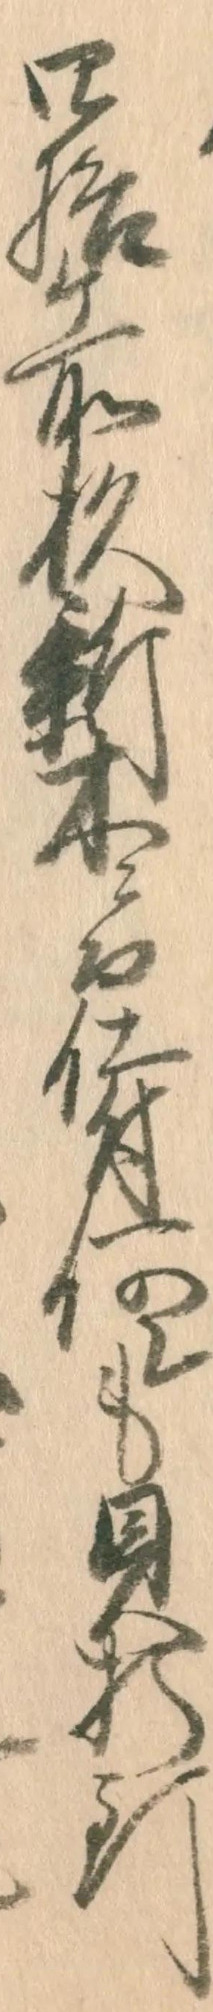四拾ケ所杉新木ニ而仕付何レも貝折釘
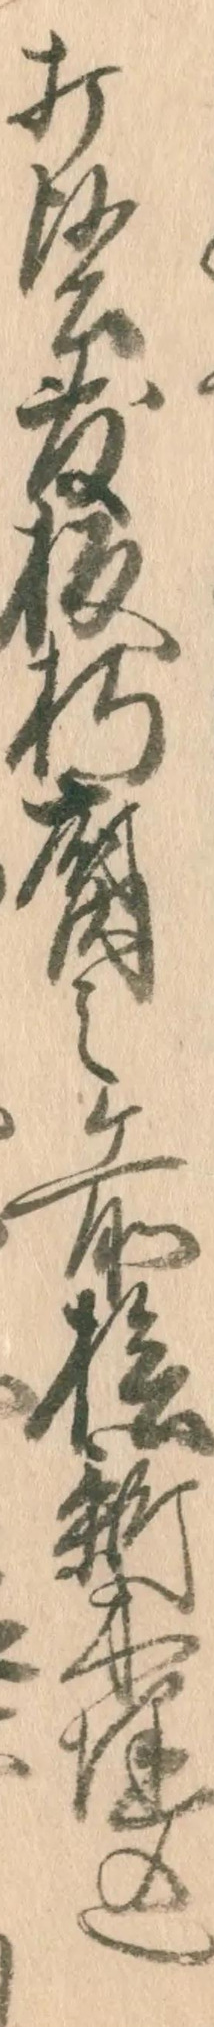打堅敷板朽腐之ケ所桧新木埋込
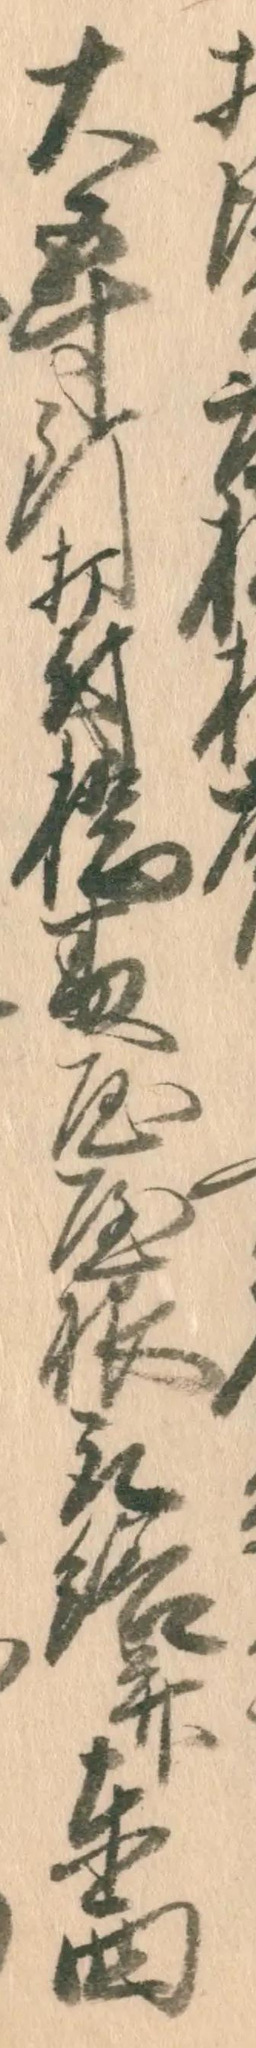大五寸釘打付橋番屋屋根取繕并東西
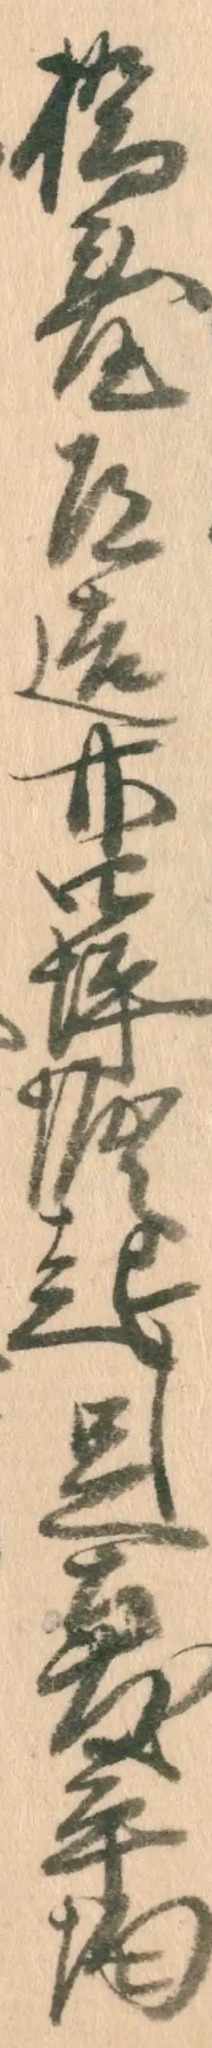橋台道造廿四坪掘起し足土敷平均
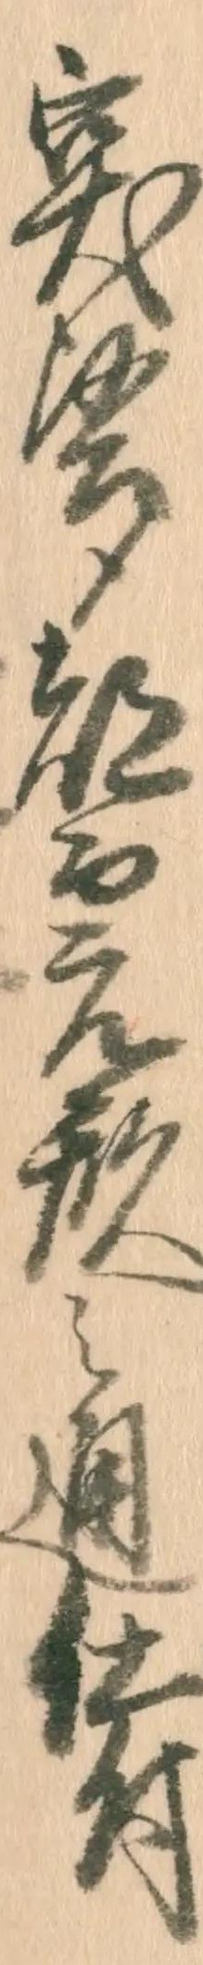突堅メ都而元形之通仕付
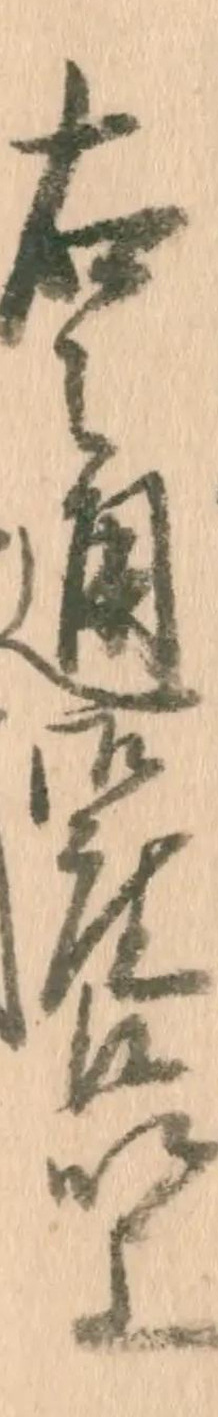右之通御座候以上
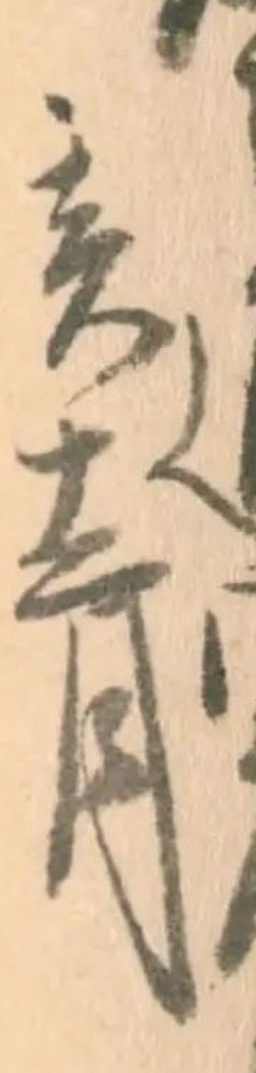亥十二月
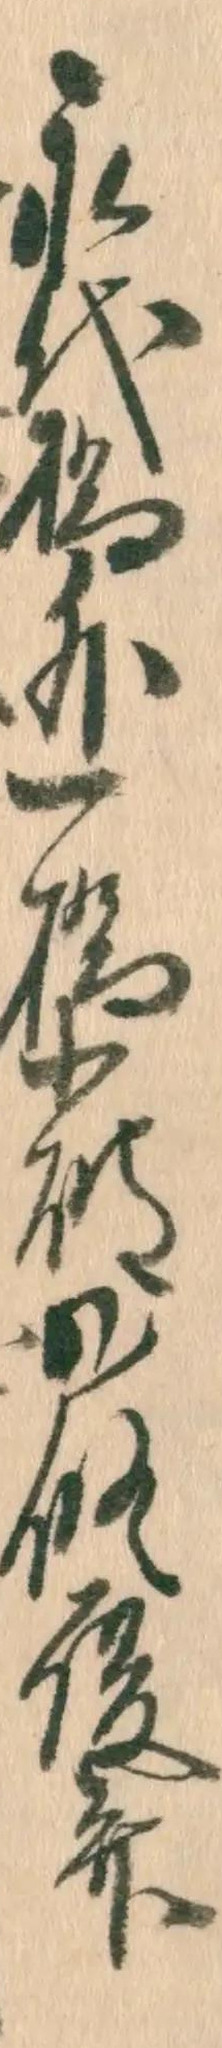永代橋外一橋小破御修復并
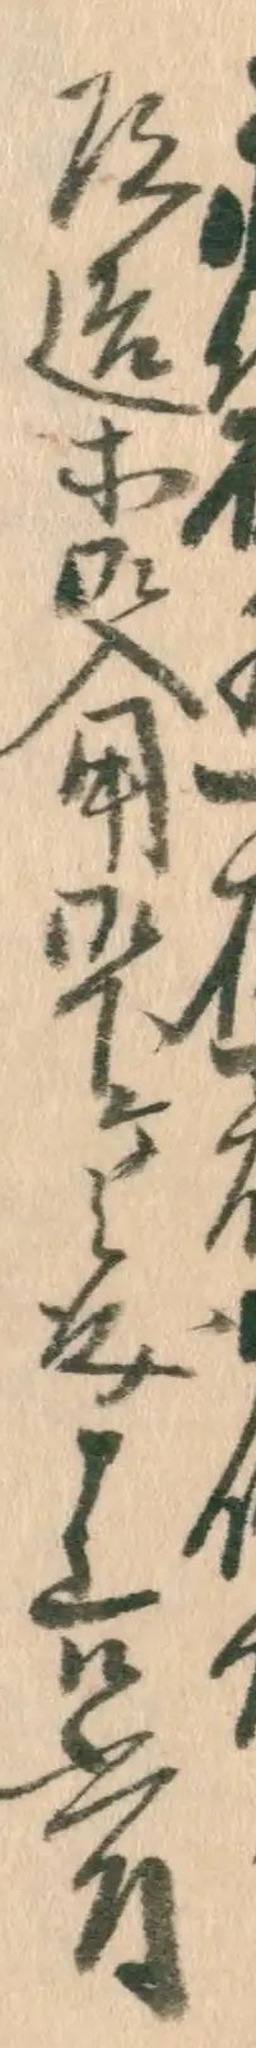道造等御入用御下ケ之儀申上候書付
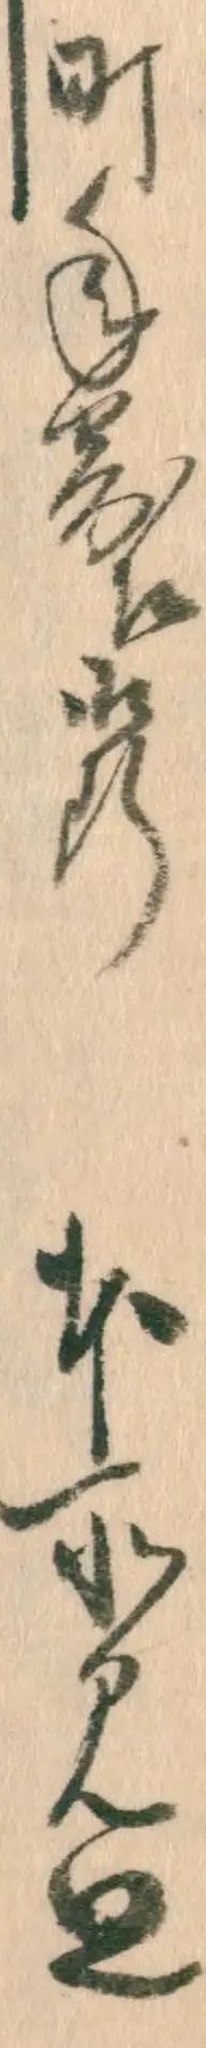町年寄え御断本所見廻
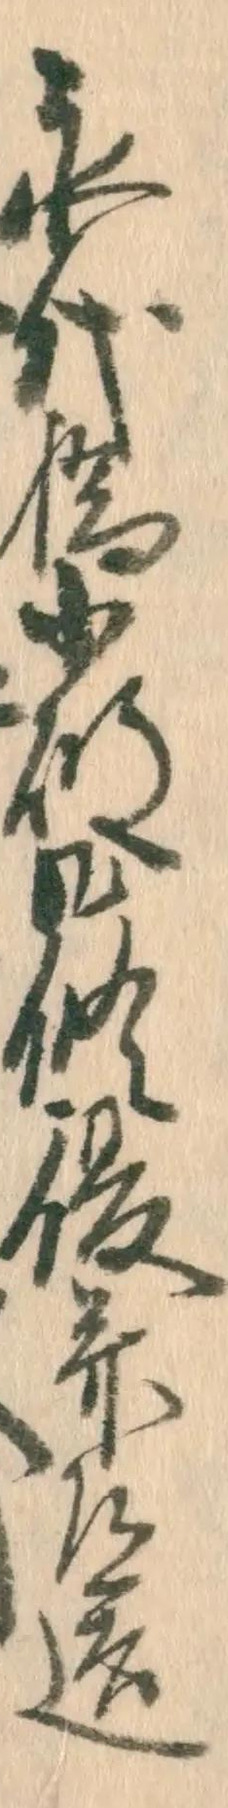永代橋小破御修復并道造
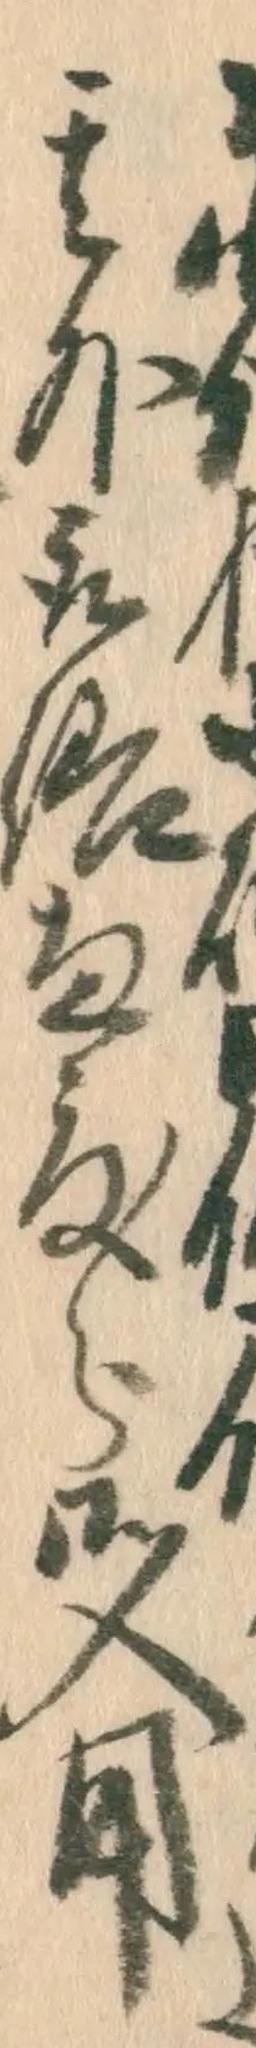其外取繕両度分御入用
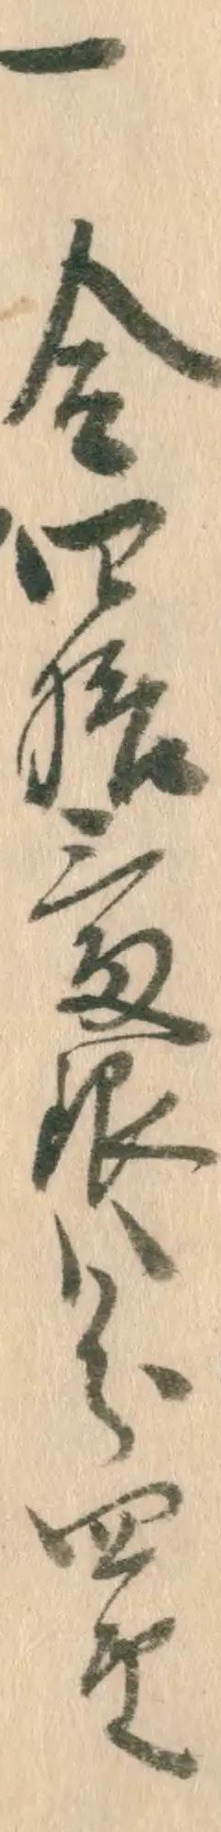一金四拾三両銀八分四厘
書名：三橋 17巻. [7] 三橋小破御修復書留　但御奉行御掛リ替地震潰橋番屋　嘉永四亥年より安政二卯年迄　上
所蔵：国立国会図書館 National Diet Library, JAPAN
